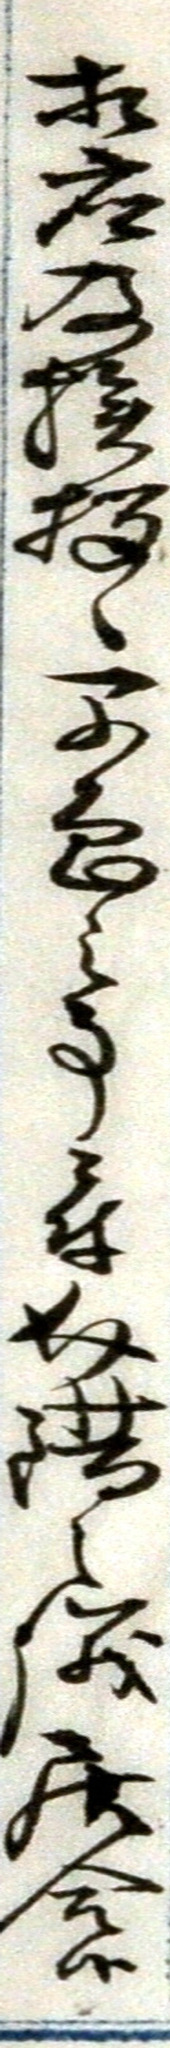相応及挨拶候早急之事ニ付介錯之儀居合候
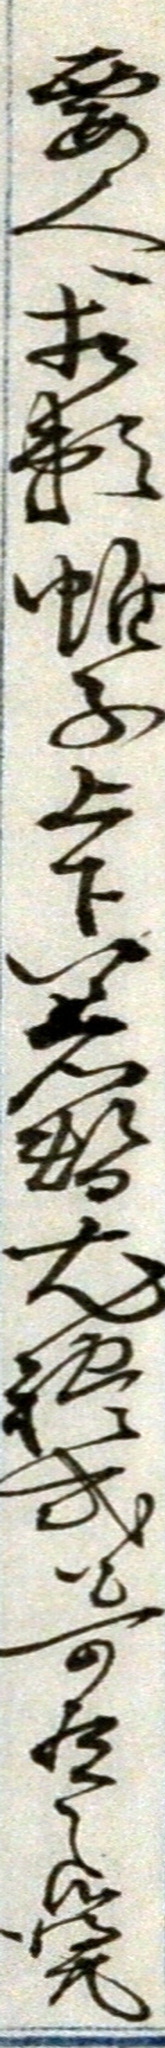要人へ相頼帷子上下着替尤礼式も可有之候得共
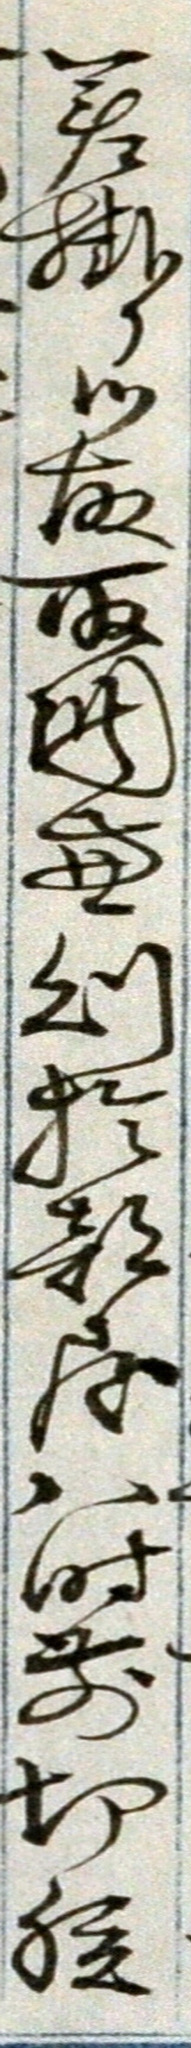差掛り候故取調兼則於部屋八時前切腹
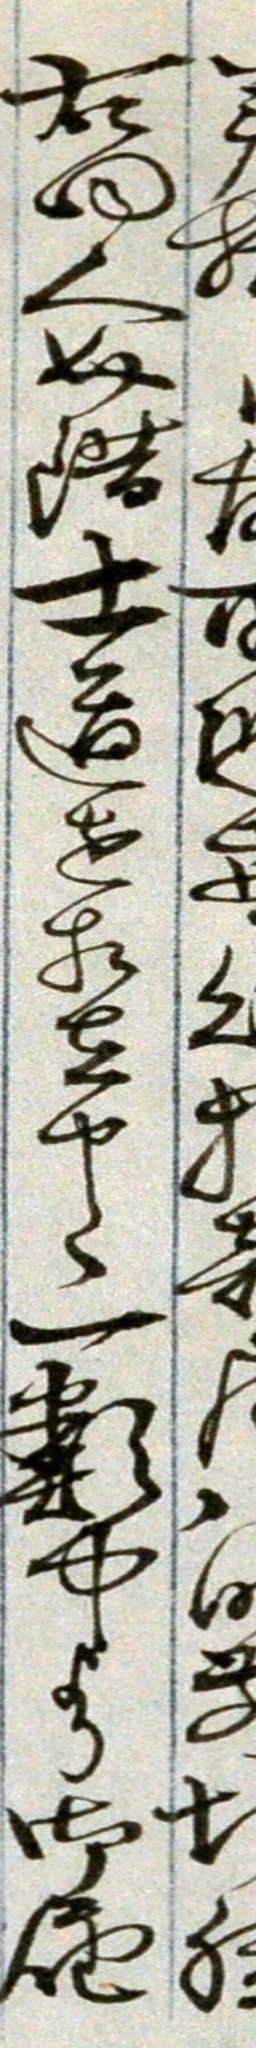右同人介錯士道相立申候一類中より御届
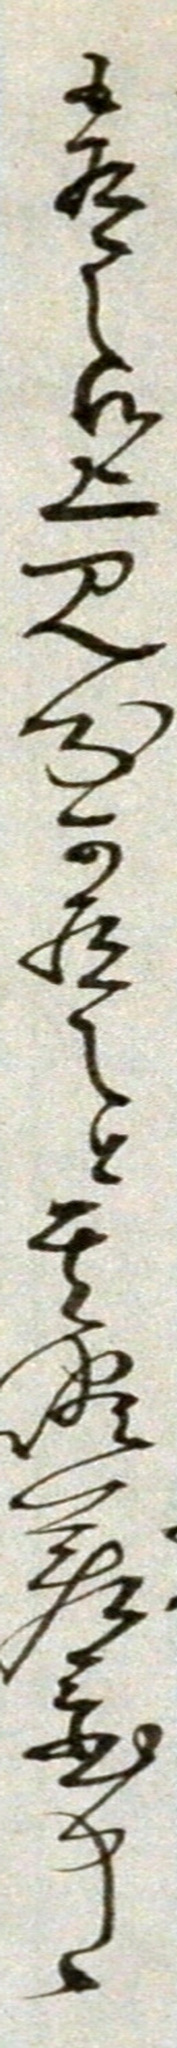も有之候上見分可有之と其儘差置申候
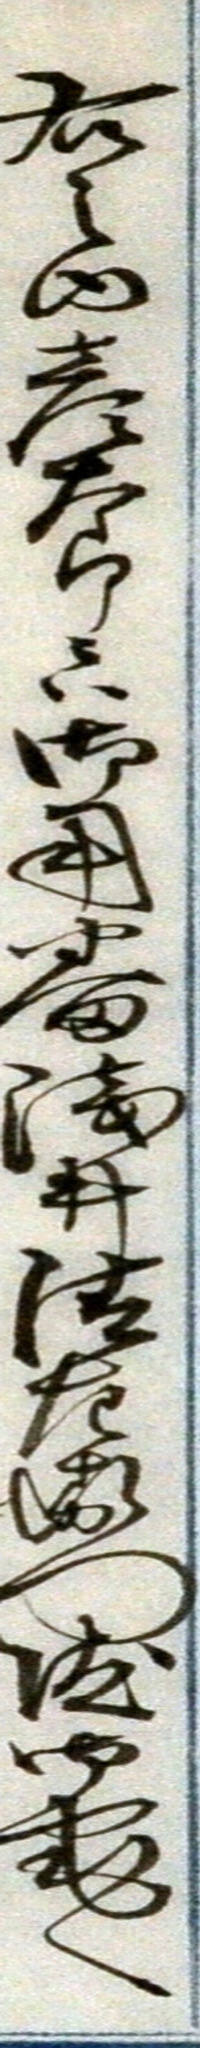一右之内彦太郎ニハ御用番浅井清左衛門殿御宅へ
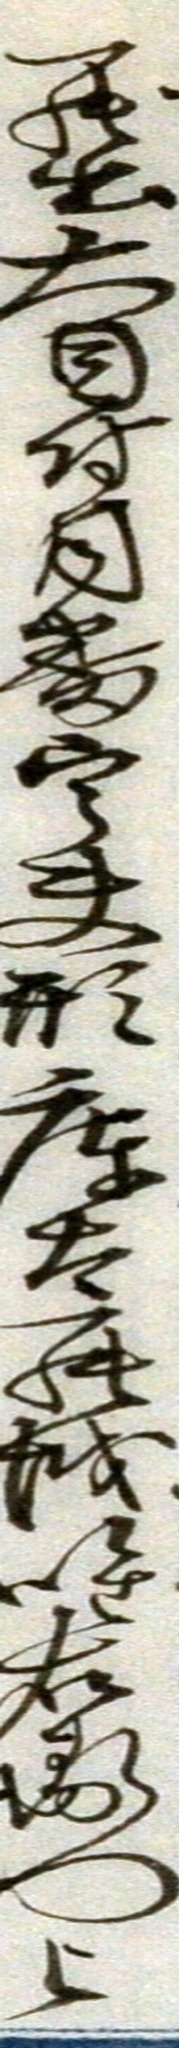罷出大目付月番宇夫形庫太罷越唯右衛門被
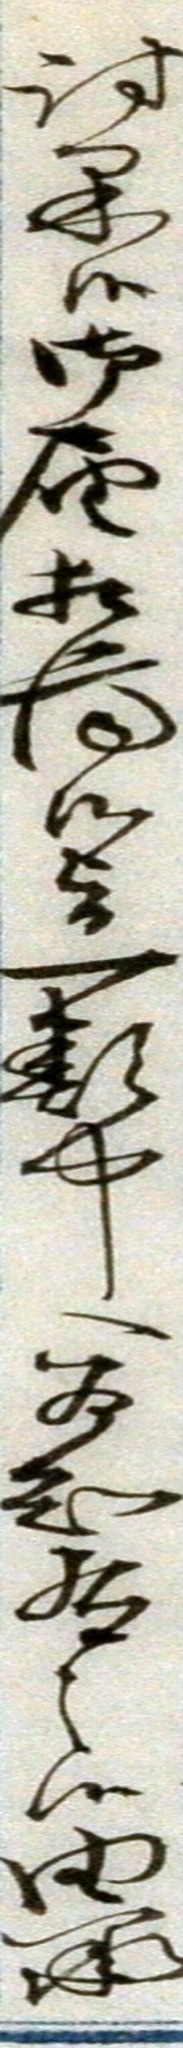討果候御届相済候旨一類中へ為知有之候由承
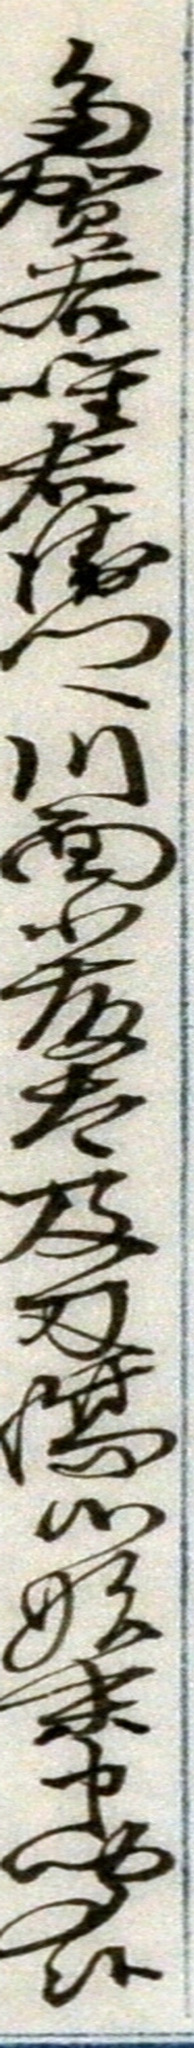多賀谷唯右衛門へ川面小藤太及刃傷候始末申聞候
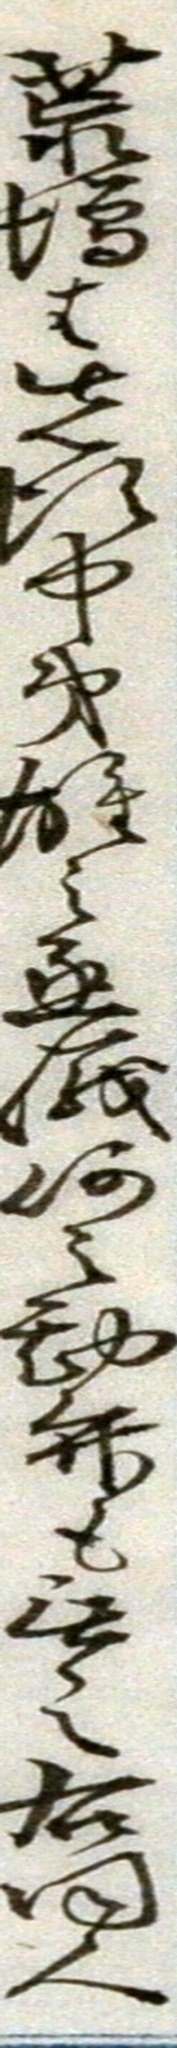荒増者先頃中弟雄之丞儀何之勘弁も無之右同人
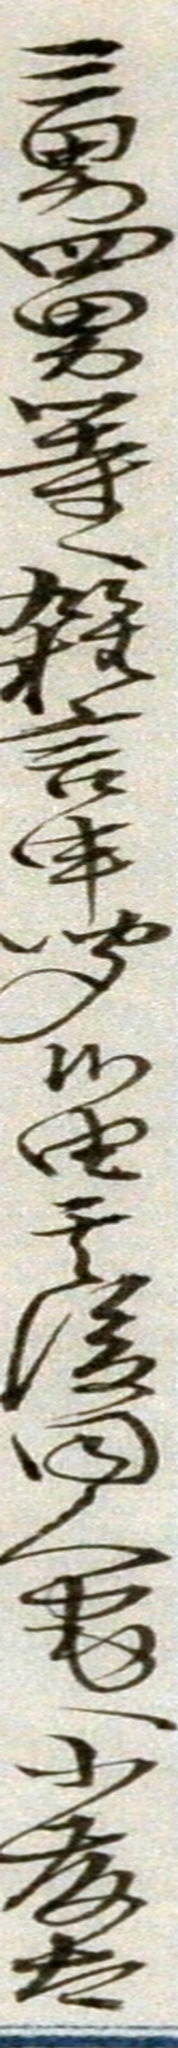三男四男等へ雑言申聞候由其後同人宅へ小藤太
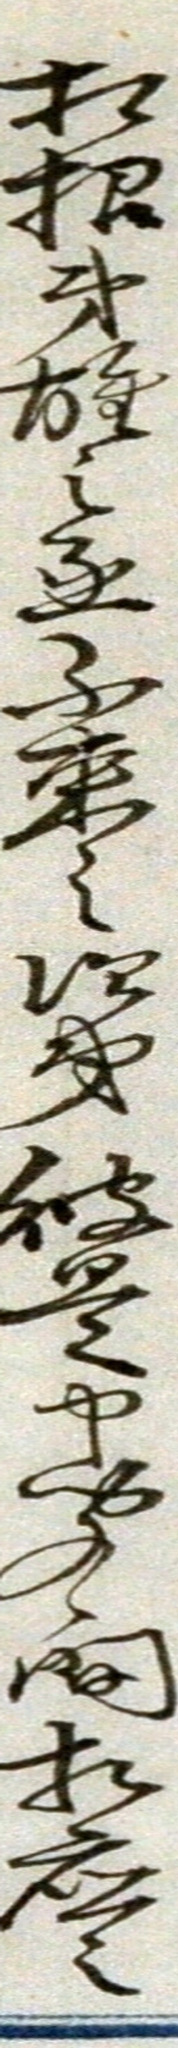相招弟雄之丞不束之次第彼是申聞候間相応之
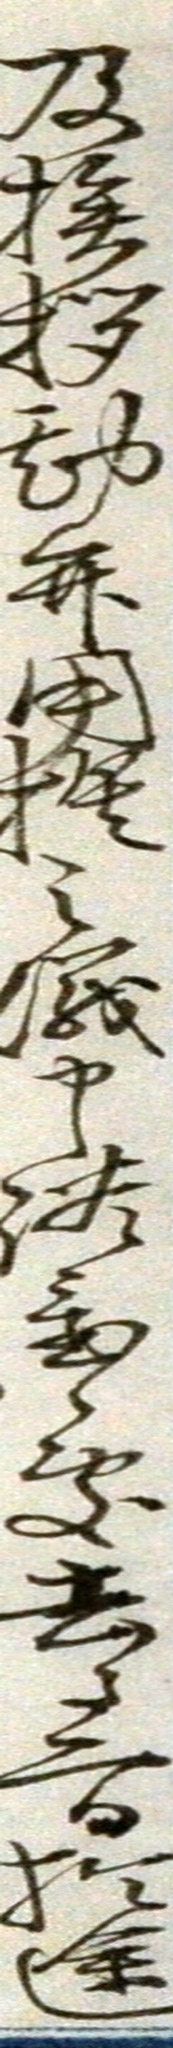及挨拶勘弁用捨之儀申談置候處去る二日於途
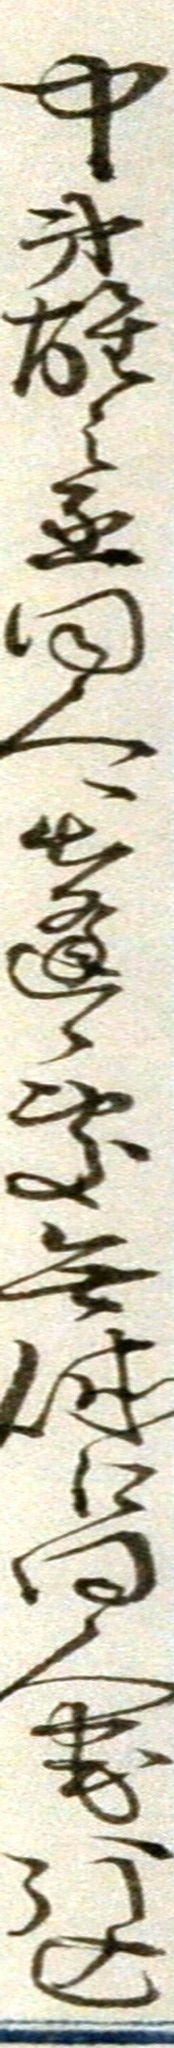中弟雄之丞同人へ出逢候處無体に同人宅へ引込

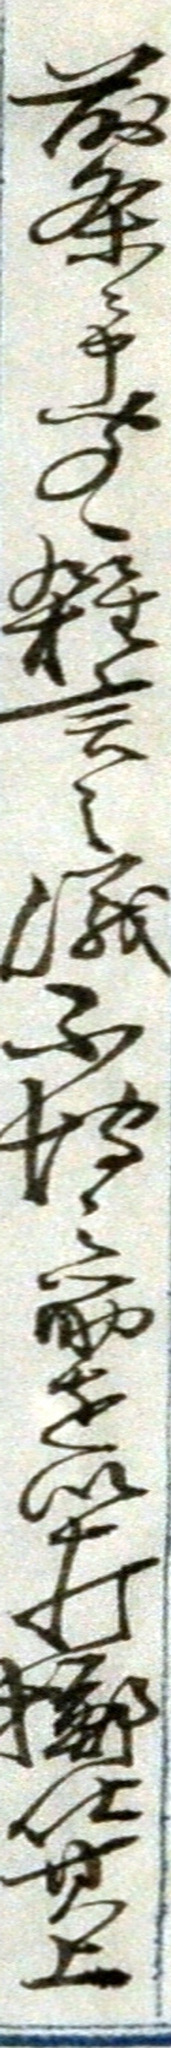前条ニ申聞候雑言之儀不埒之筋を以打擲仕其上
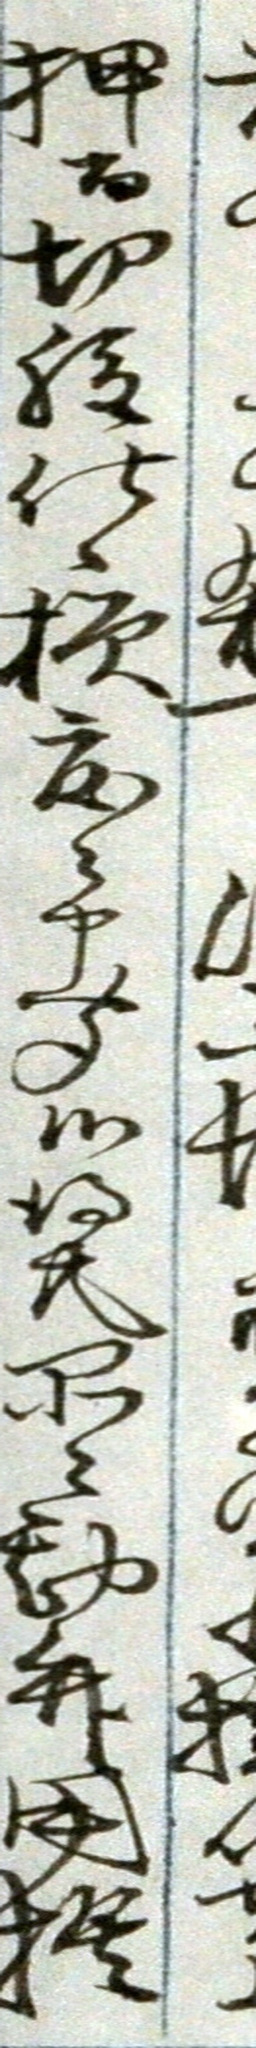押而切腹仕候様度々申聞候得共品々勘弁用捨
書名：川面小藤太子細有之多賀谷唯右衛門ヲ打果候一件
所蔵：伊那市立高遠町図書館・合同会社AMANE
